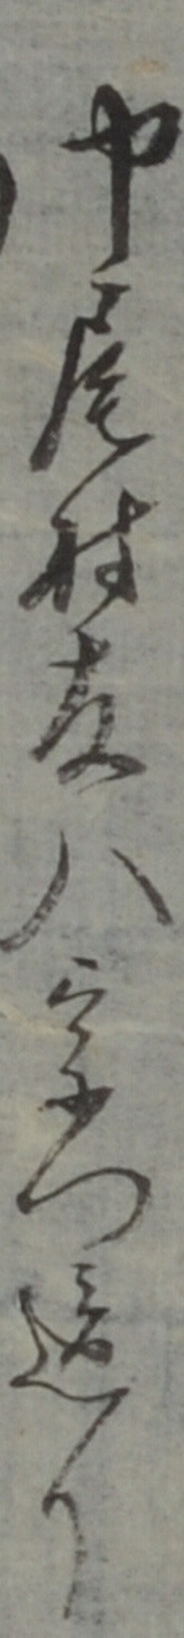中尾村友八宗門送り

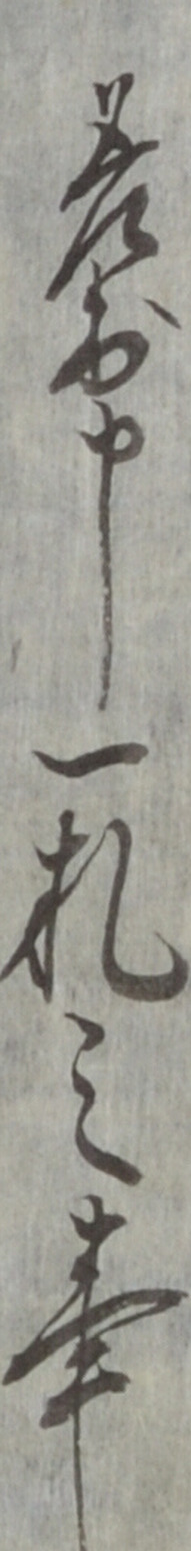差出申一札之事
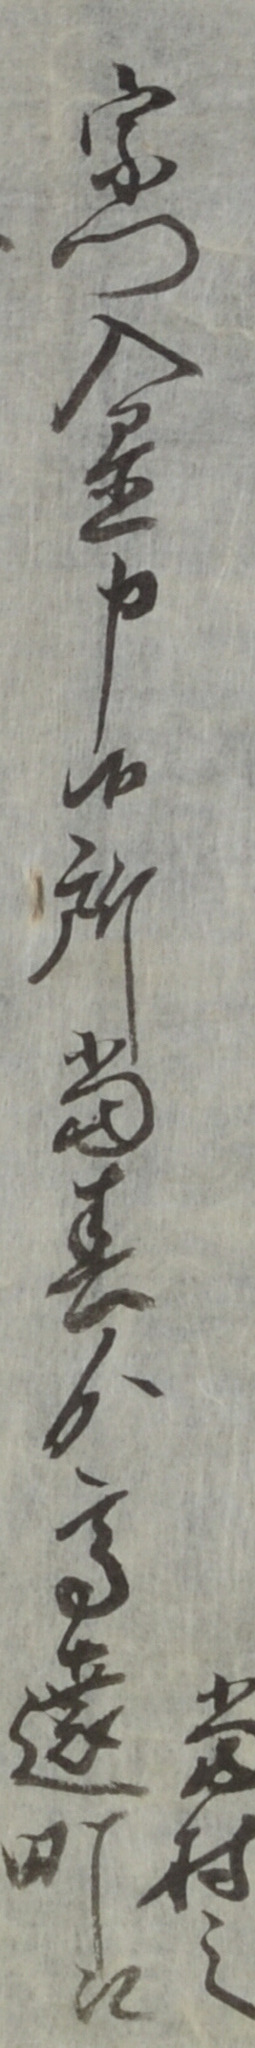宗門入置申候所当春ゟ高遠町江
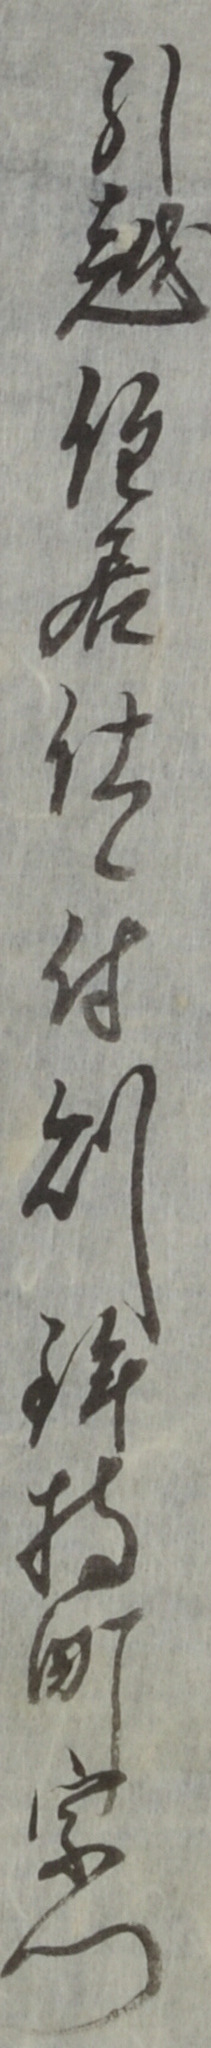引越住居仕候付則鉾持町宗門
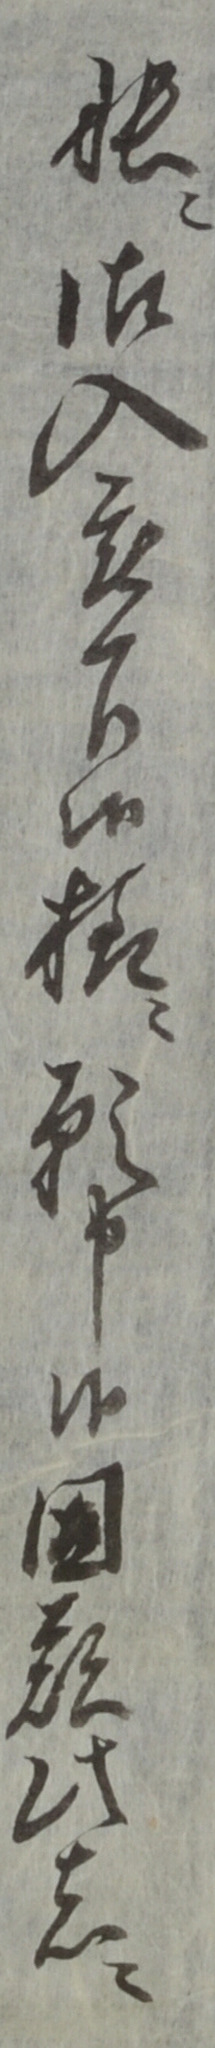帳ニ御入被下候様ニ願申候困難此者ニ
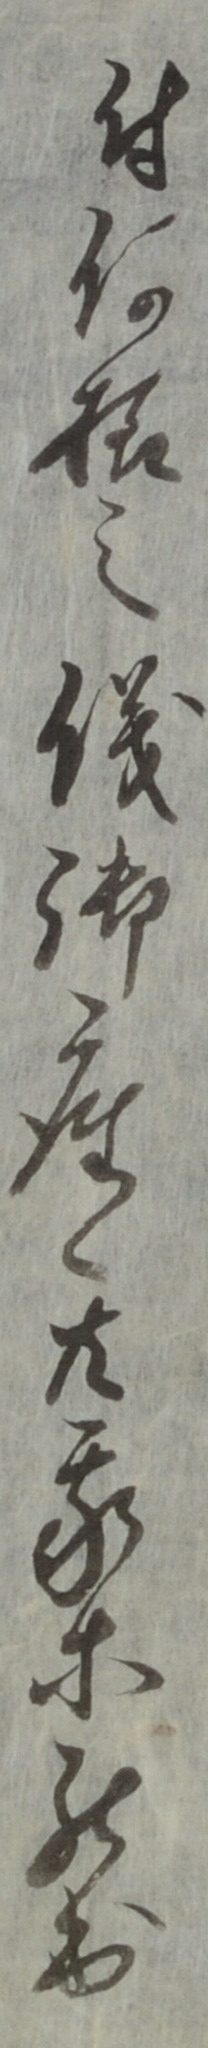付何様之儀御座候共我等罷出
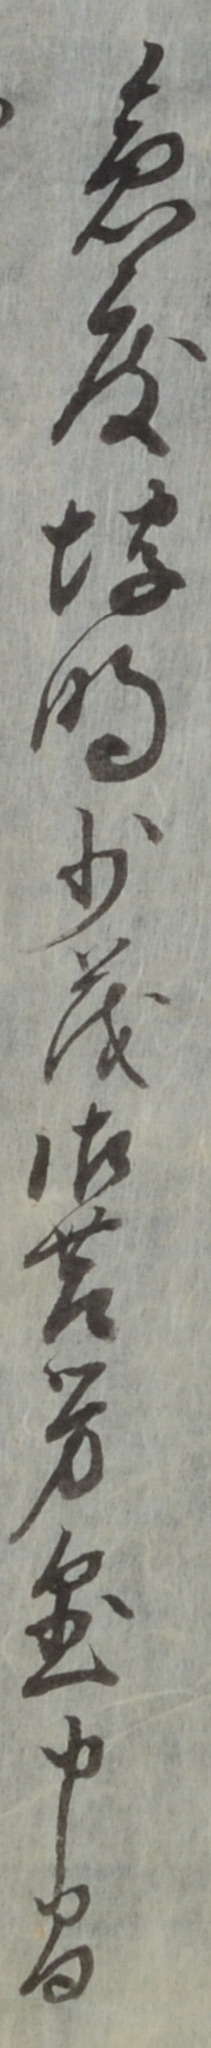急度埒明少も御苦労置申間
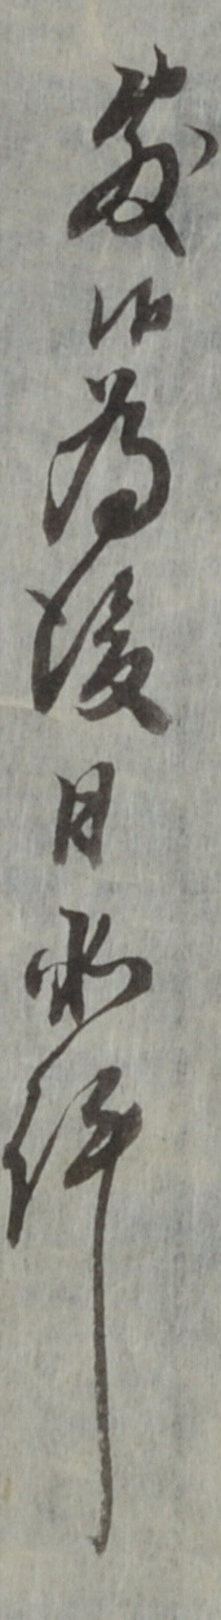敷候為後日如件
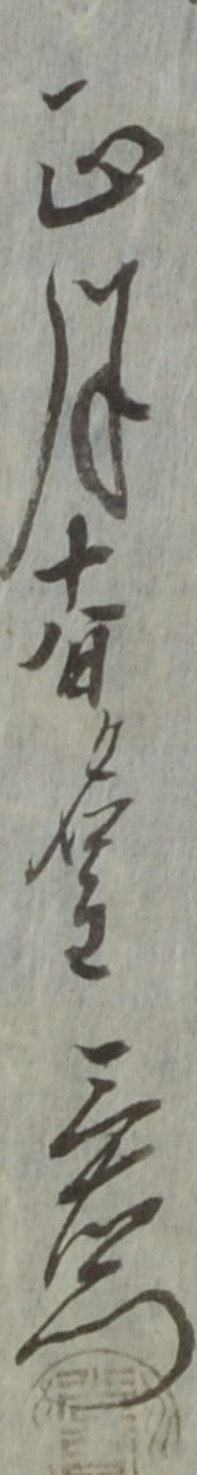正月十八日名主三右衛門㊞
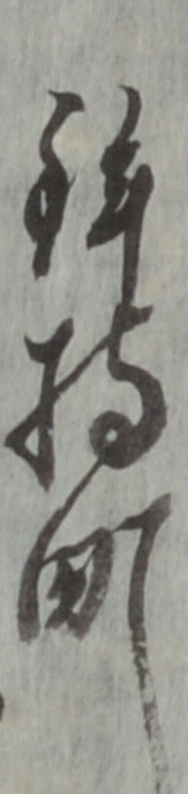鉾持町
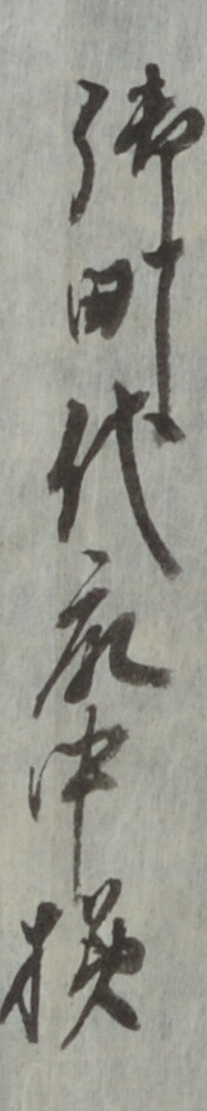御町代衆中様
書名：差出申一札之事
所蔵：伊那市立高遠町図書館・合同会社AMANE
